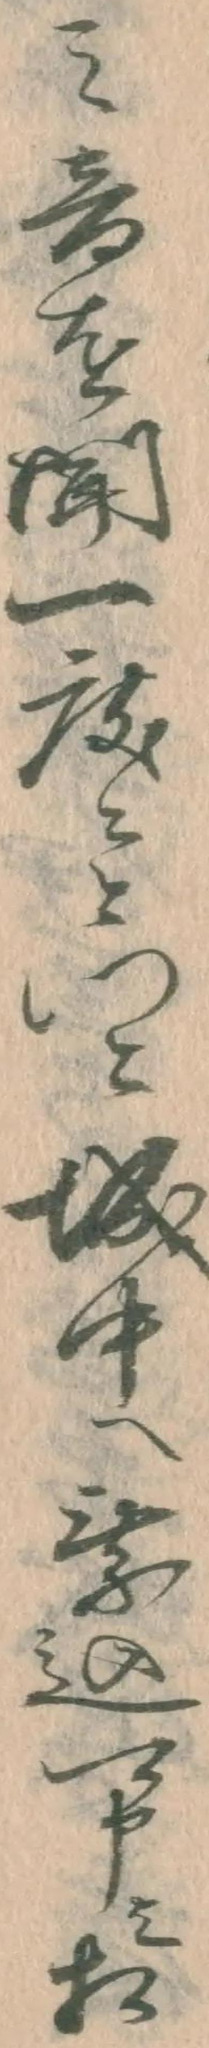之音を聞一度にと川と城中へ乗込可申与相
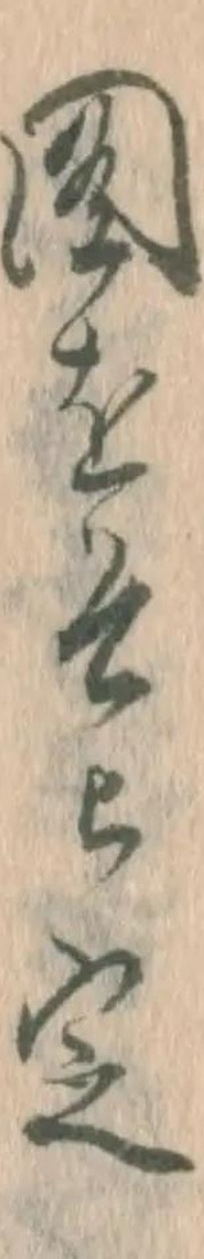図を今被定
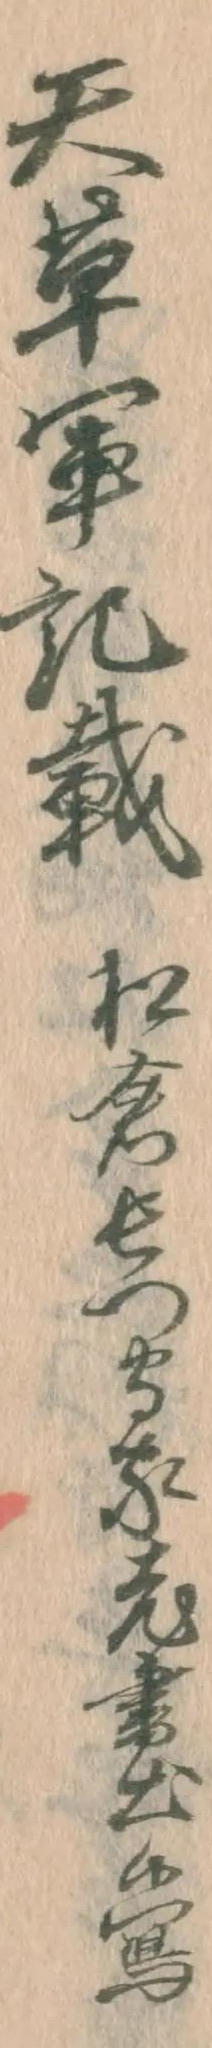天草軍記載松倉長門守家老書出候写
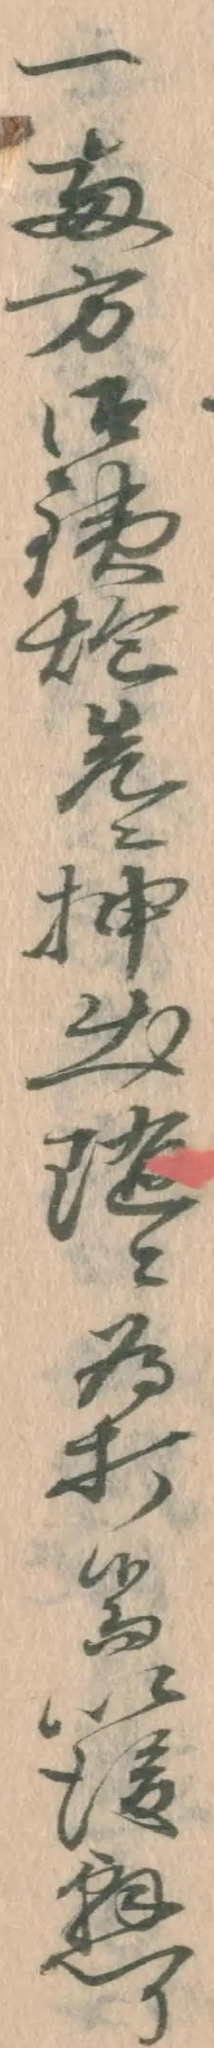一両方御鉄炮先に押出随に為打候而以後懸り
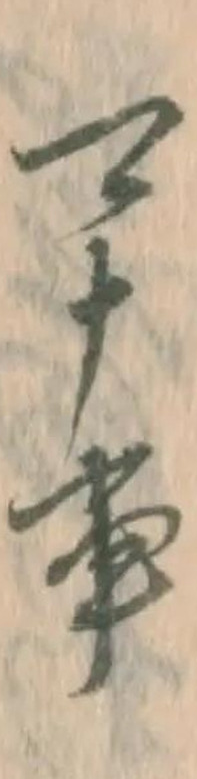可申事
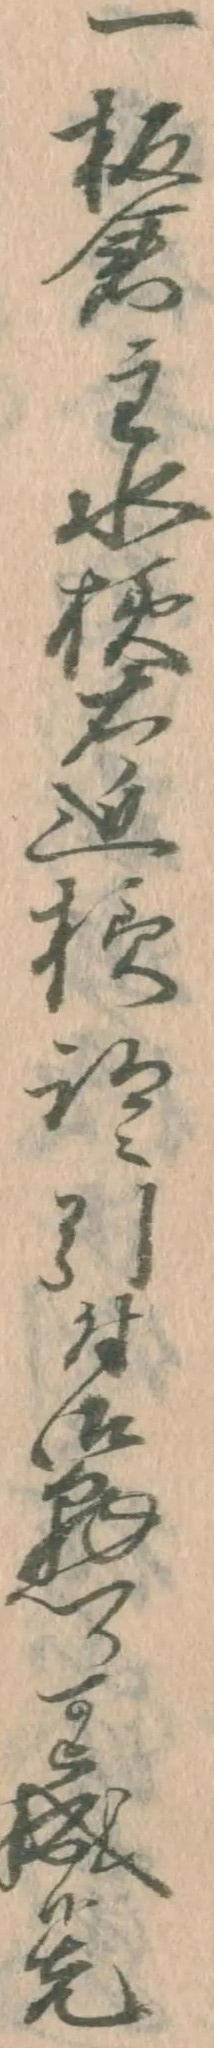一板倉主水様右近様跡に引付御懸り可被成候先
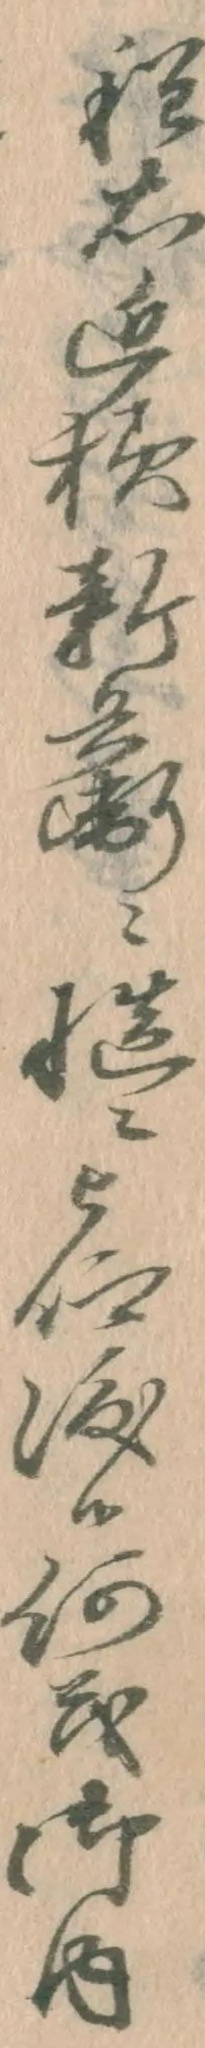程右近様新兵衛に慥に被仰渡候何茂御内
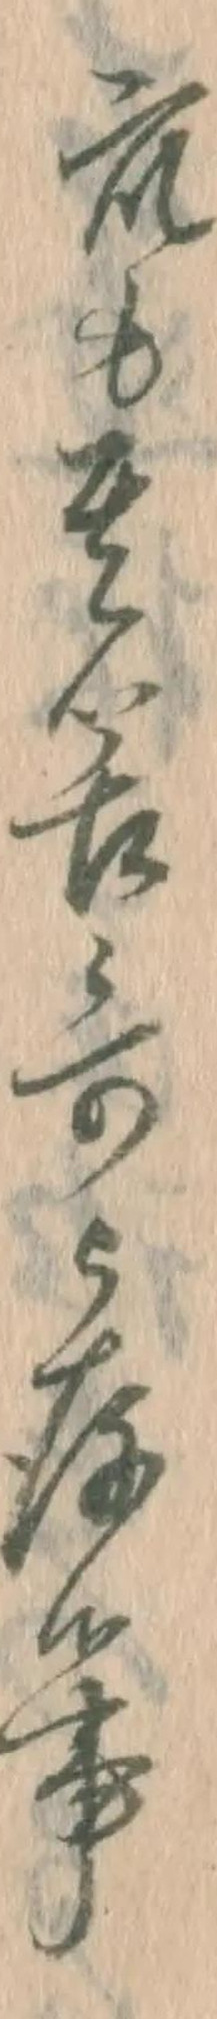衆も其筈に可被存候事
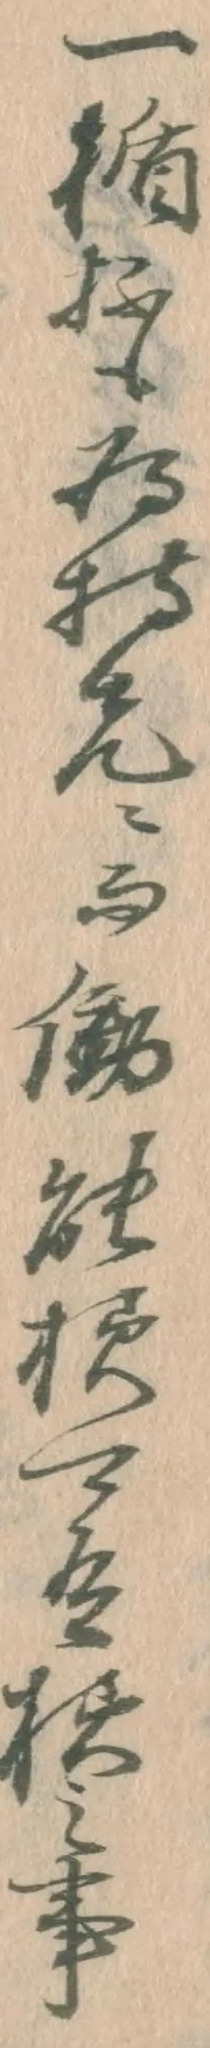一楯抔も為持先に而働能様可有様之事
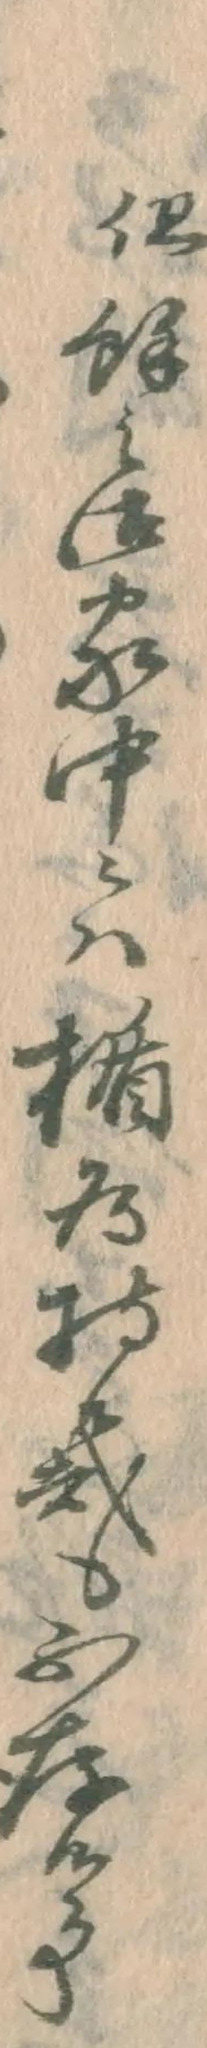但余之御家中には楯為持候哉もふ存候事
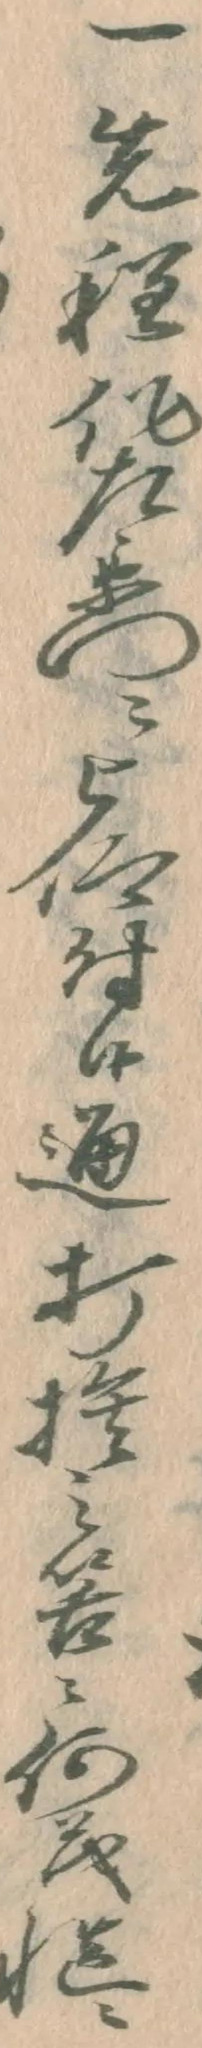一先程作左衛門に被仰付候通打捨之筈に何茂慥に
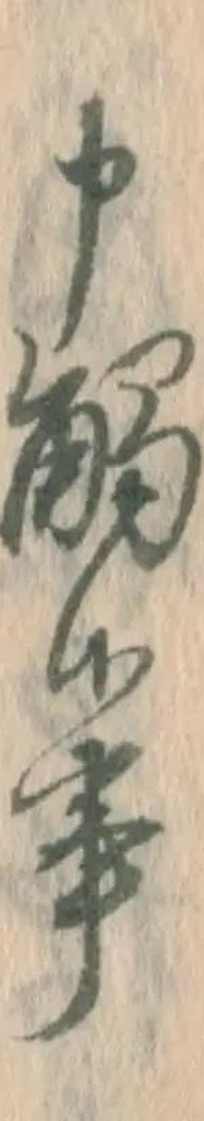申觸候事
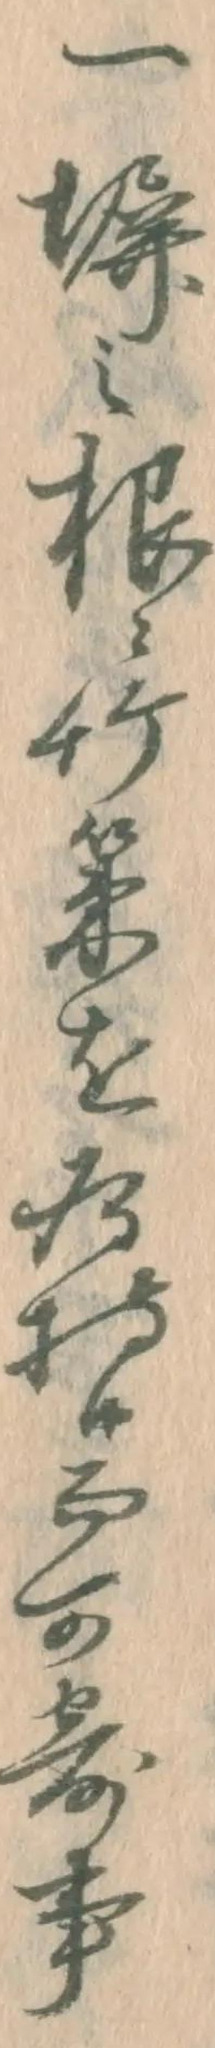一塀之根に竹束を為持候而可寄事
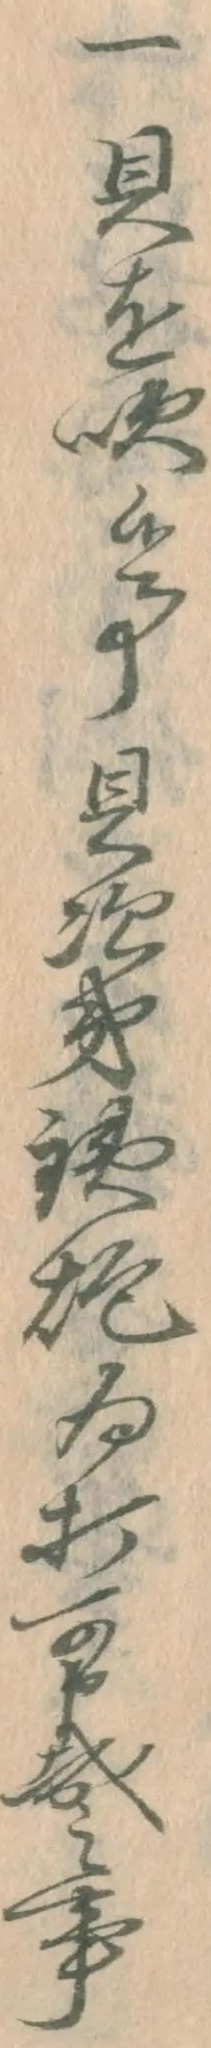一貝を吹候事貝次第鉄炮為打可申哉之事

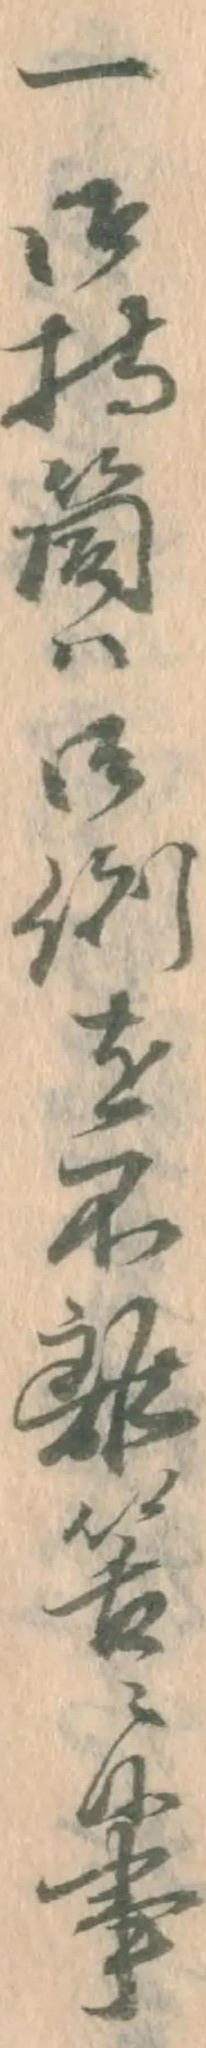一御持筒は御例を不離筈に候事
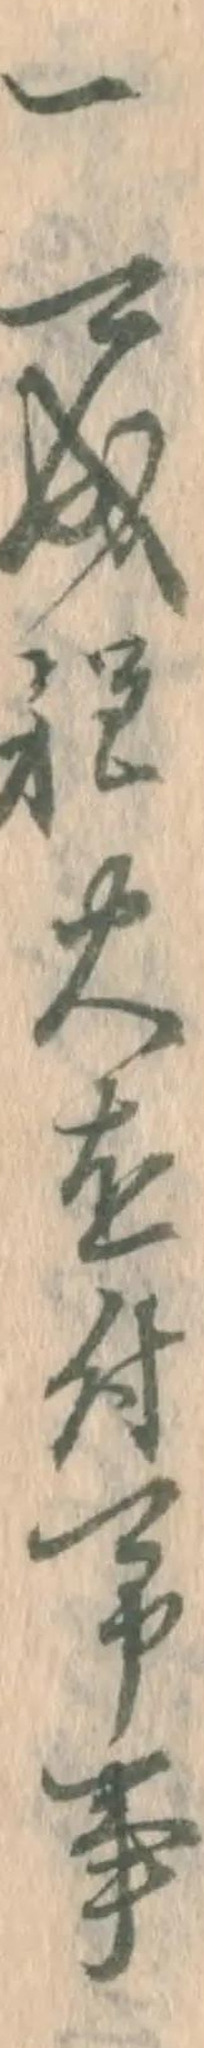一可成程火を付可申事
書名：切支丹御退治記 49巻. [5]
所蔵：国立国会図書館 National Diet Library, JAPAN
